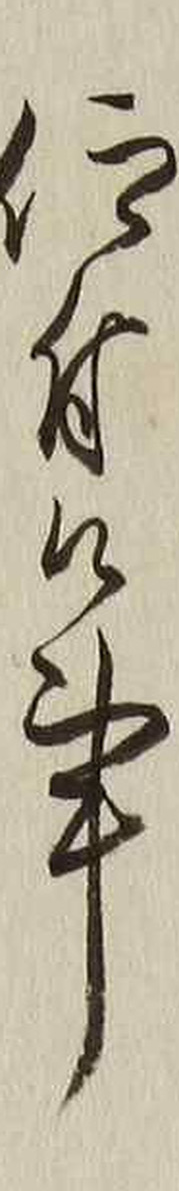仰付候事
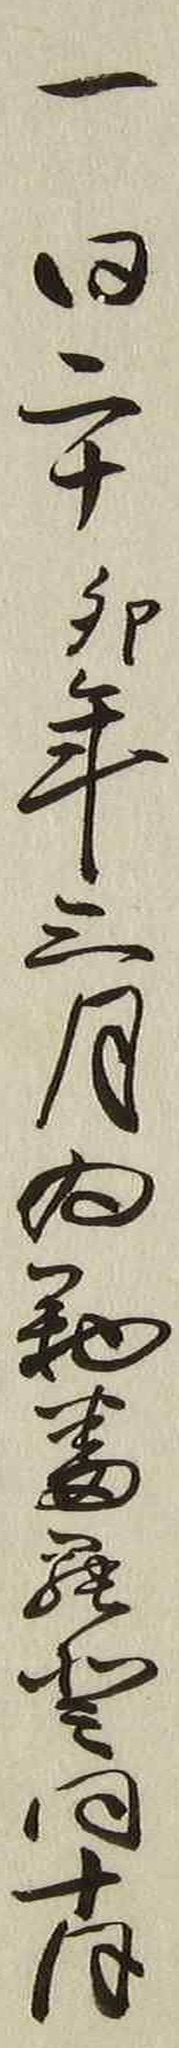一同二十卯年三月為勤番罷登同十月
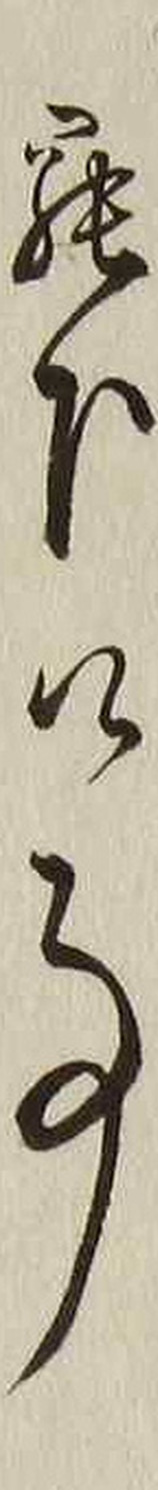罷下候事
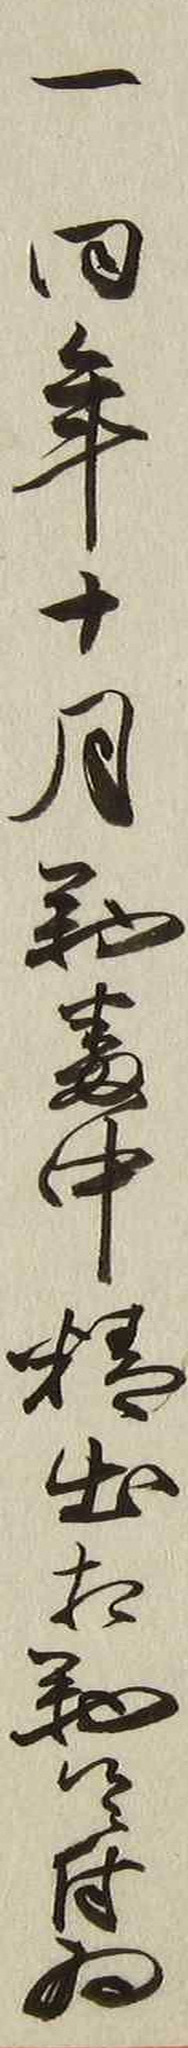一同年十月勤番中精出相勤候ニ付為
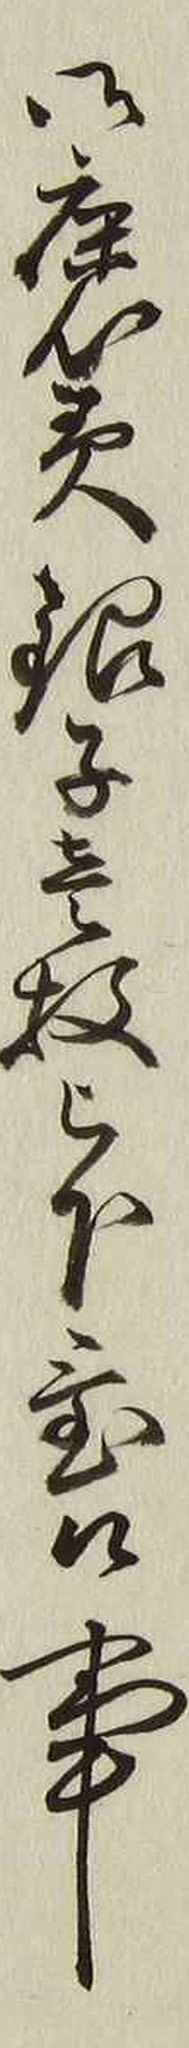御褒美銀子壱枚被下置候事
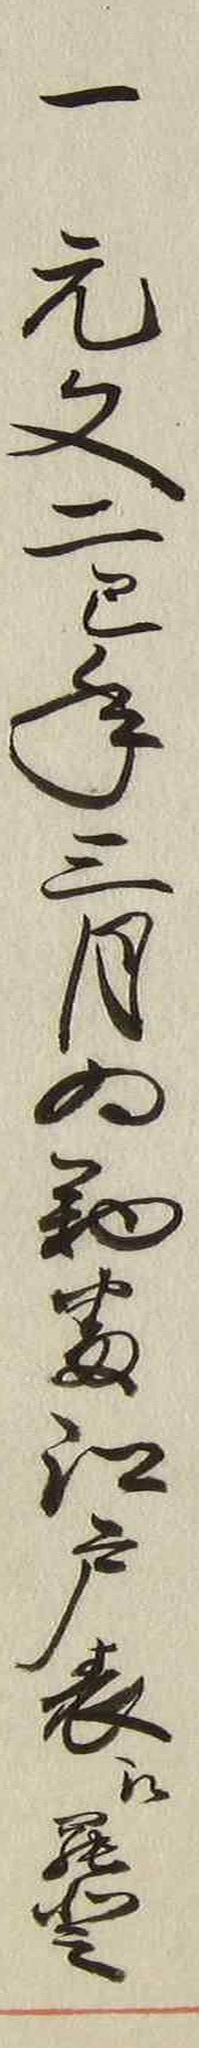一元又二巳年三月為勤番江戸表江罷登
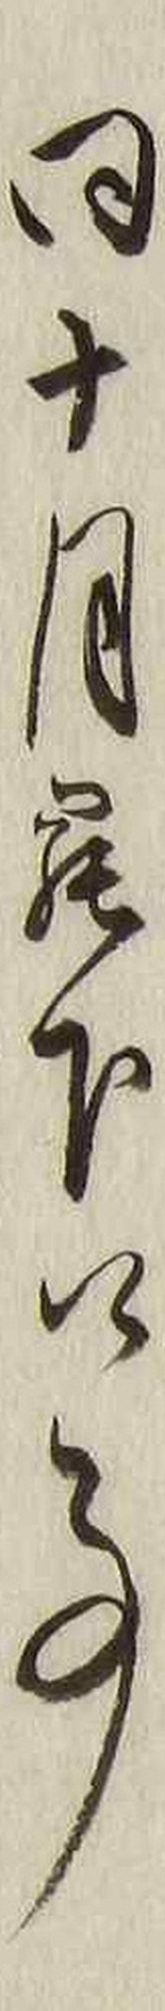同十月罷下候事
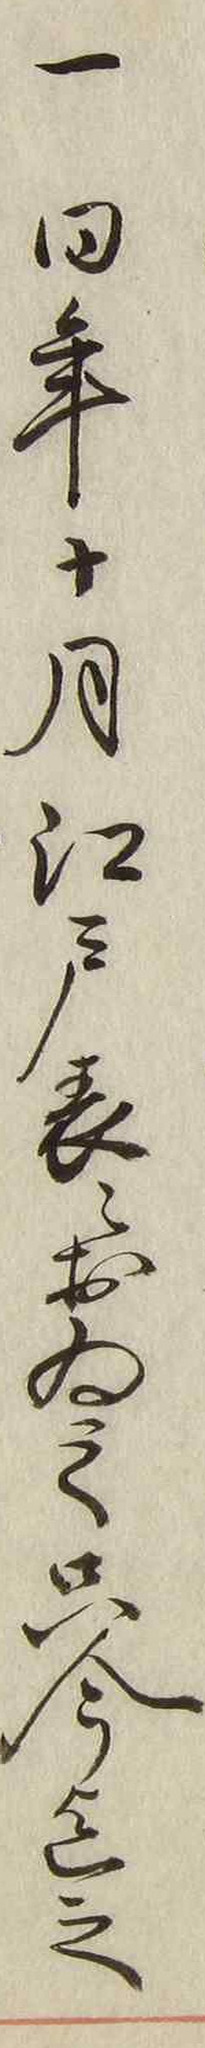一同年十月江戸表ニおゐて只今迄之
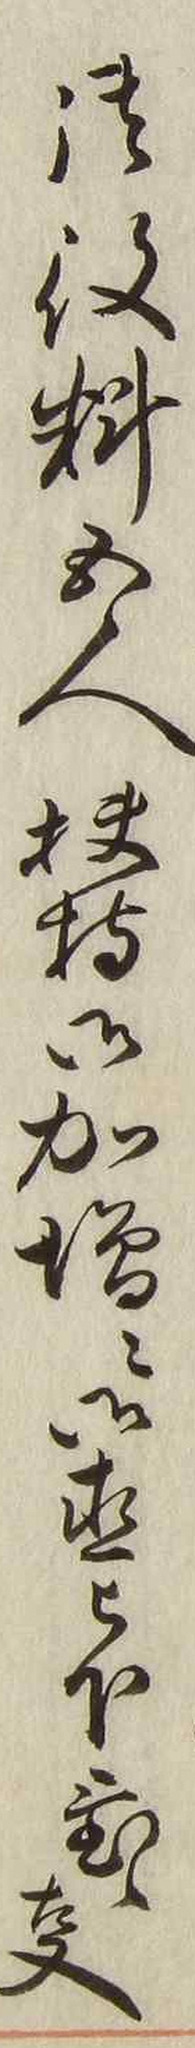御役料五人扶持御加増ニ御直被下置候事

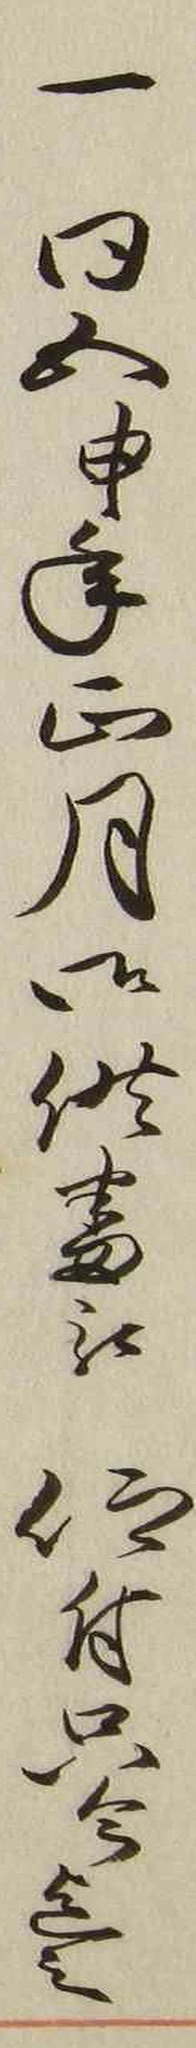一同五申年正月御供番被仰付只今迄之
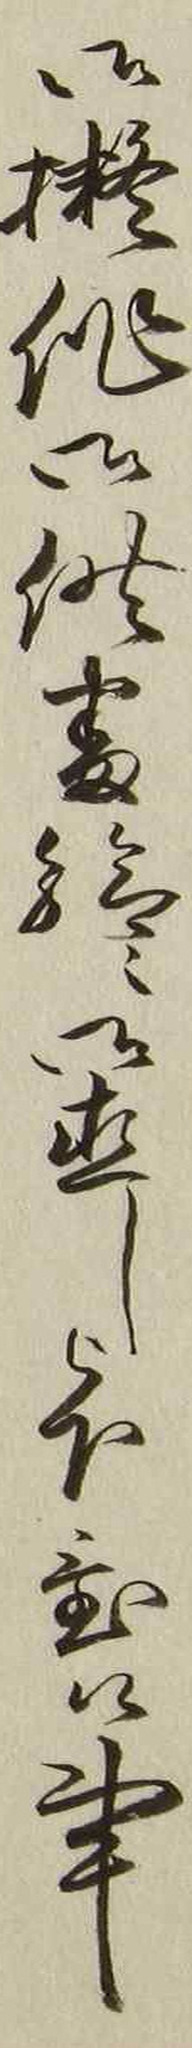御擬作御供番給ニ御直し被下置候事
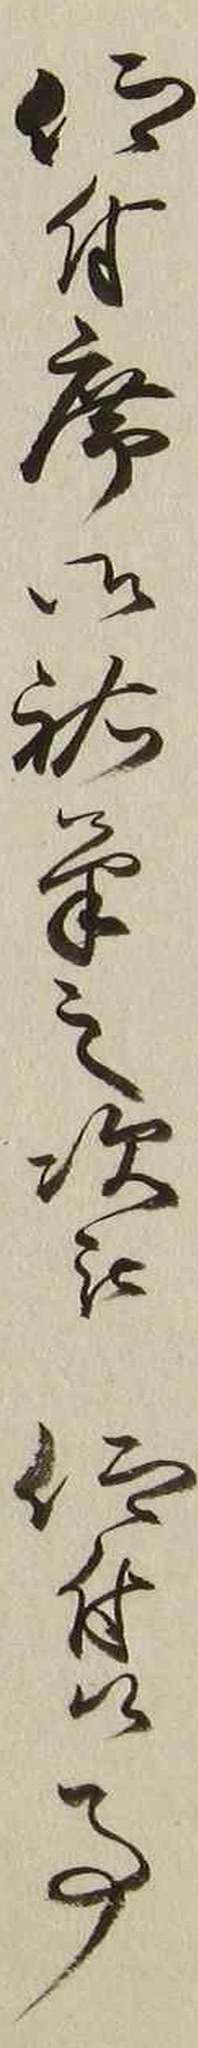仰付席御祐筆之次被仰付候事
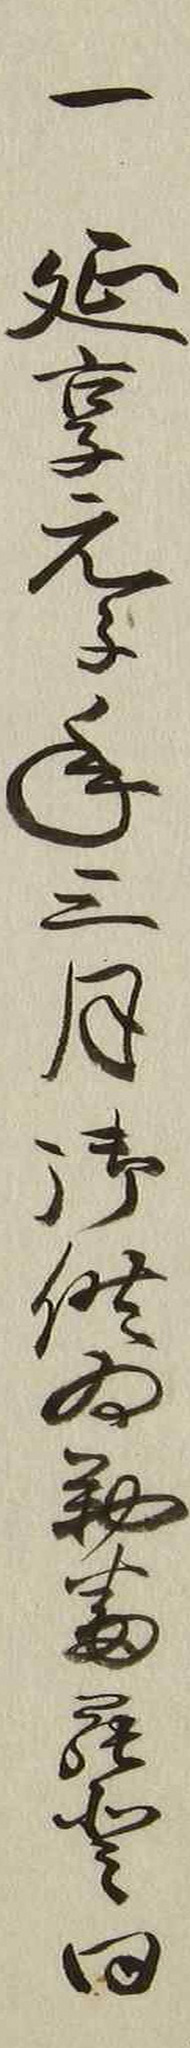一延享元子年三月御供為勤番罷登同
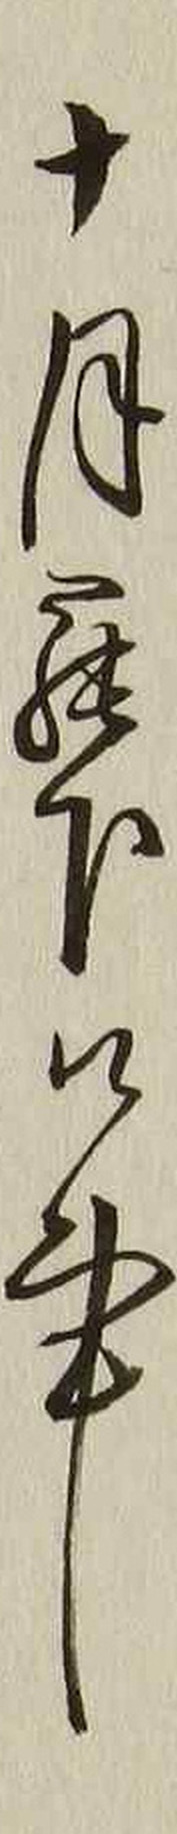十月罷下候事
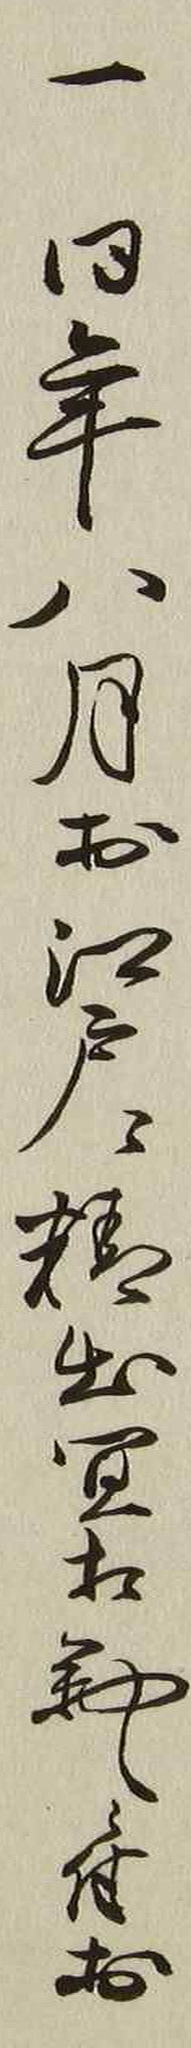一同年八月於江戸ニ精出宜相勤候ニ付於
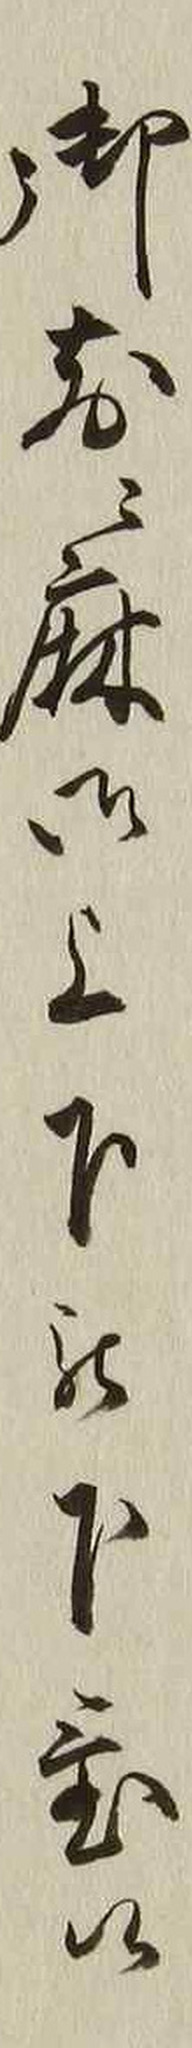御前ニ麻御上下被下置候
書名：諸士系譜　巻之21　い之部21
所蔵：会津若松市立会津図書館
